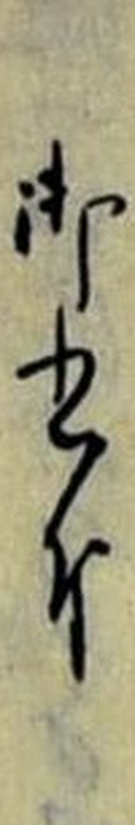御書付
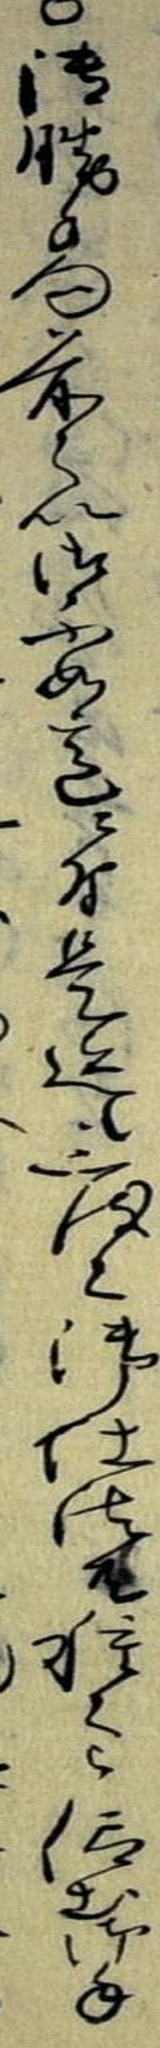〇御勝手向前々以御不如意ニ付是迄も度々御仕法共種々被仰出御手
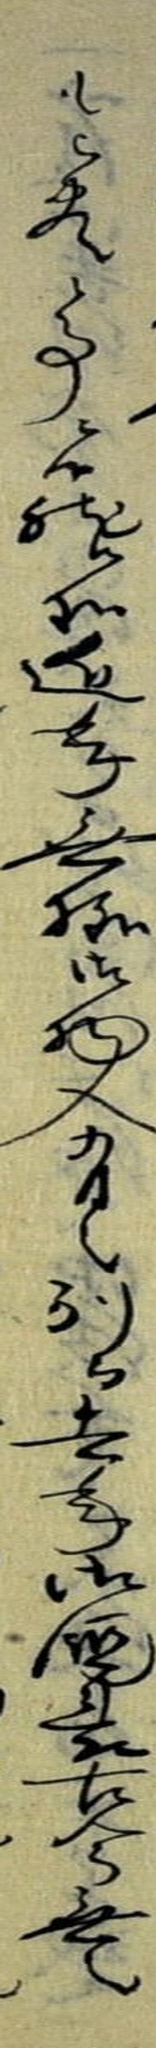も被尽候事ニ候然ル処近年無拠御物入有之別而去年御国表古今無之
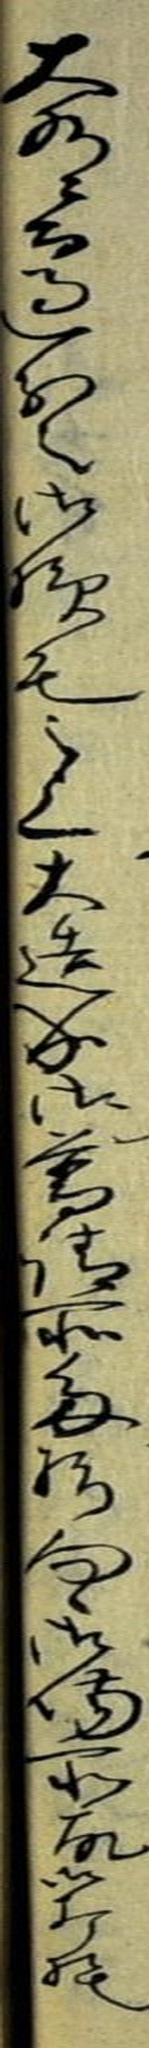大水ニ而過分之御損毛之上大造成御普請所多指向候御備所故御打捨
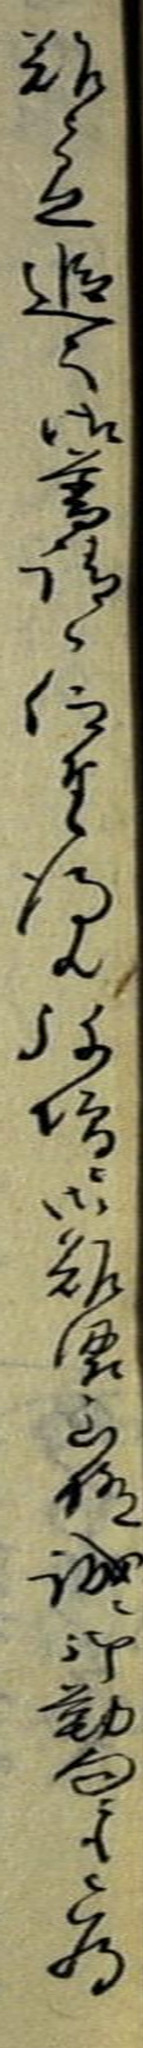難被置追々御普請被仰付候得共弥増ニ御難渋至極誠ニ御勤向ニも被為
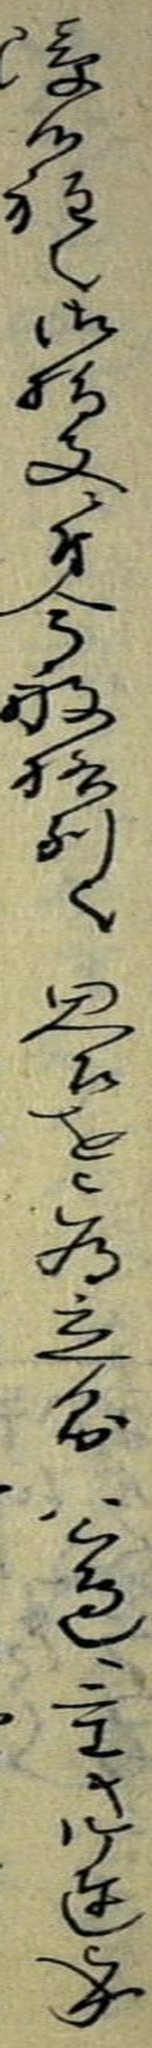障候程之御指支ニ付今般格別之思召を被為立則公辺へ重キ御達被成
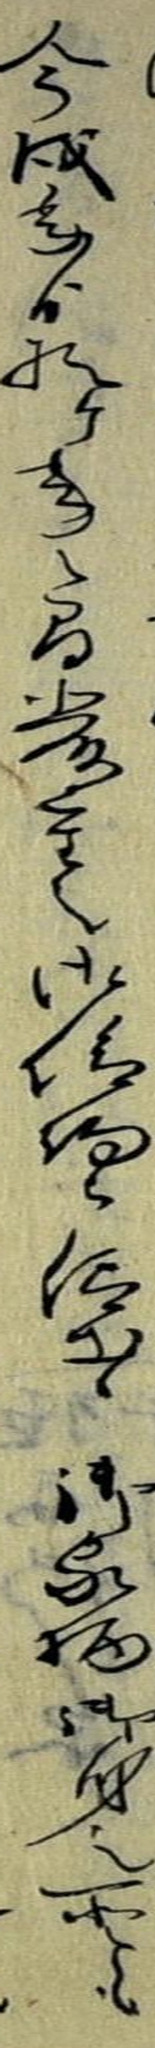今戌年ゟ拾ケ年之間厳重之御倹約被仰出候御家柄御身之所とも
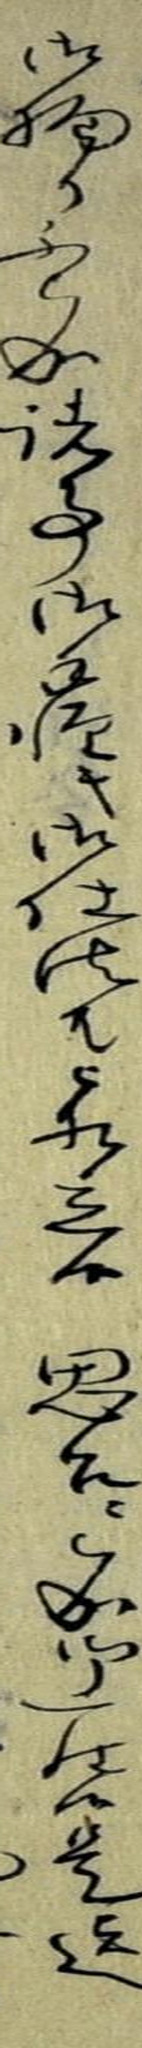御拘り不被成諸事御手軽キ御仕法共被相立候思召ニ被成御座候是迄
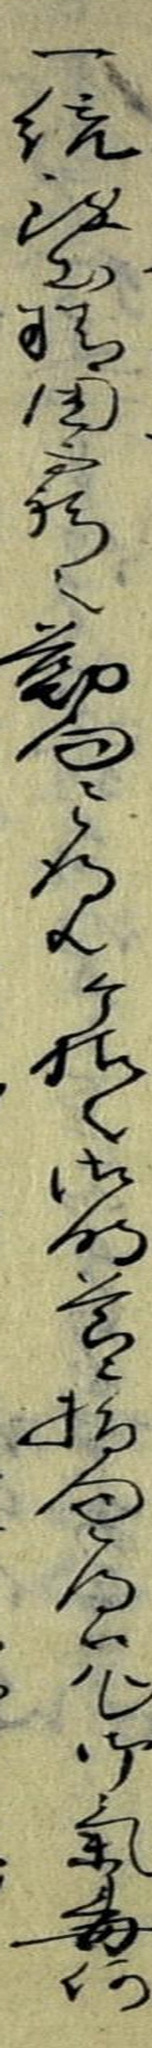一統致出精困窮之勤向ニ候得共ケ様之御時節ニ指向候得ハ乍御気毒何
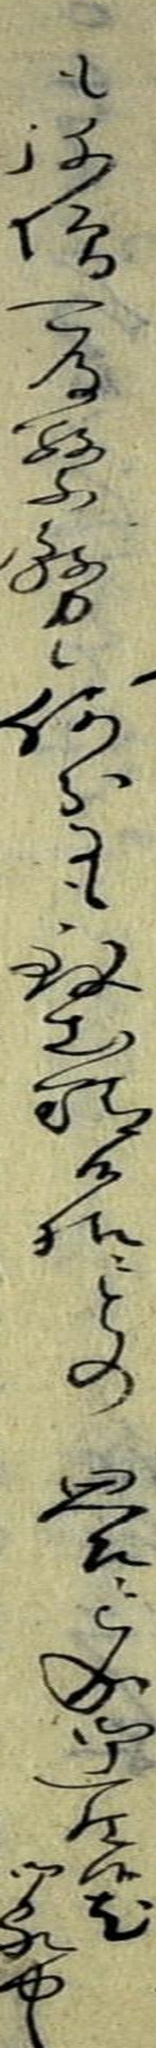も弥増可及繁務候何分にも致出精候様ニとの思召ニ被成御座候尤御家中
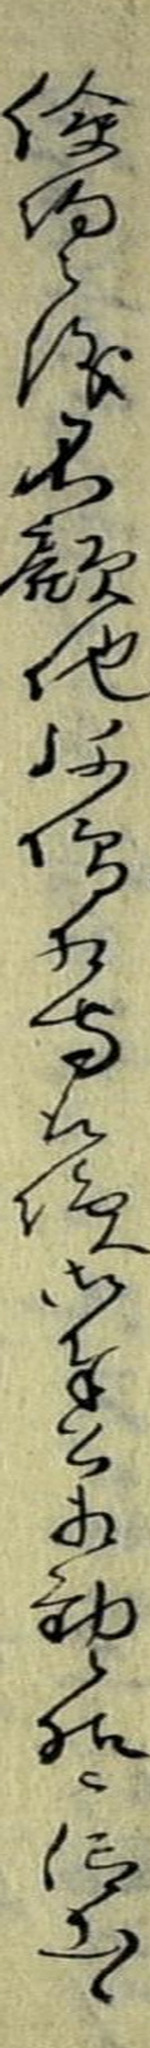倹約之儀不顧他弥増相守取続御奉公相勤候様被仰出候
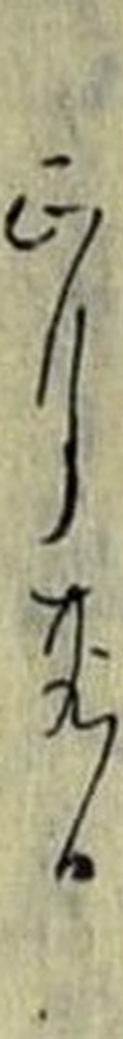正月廿九日
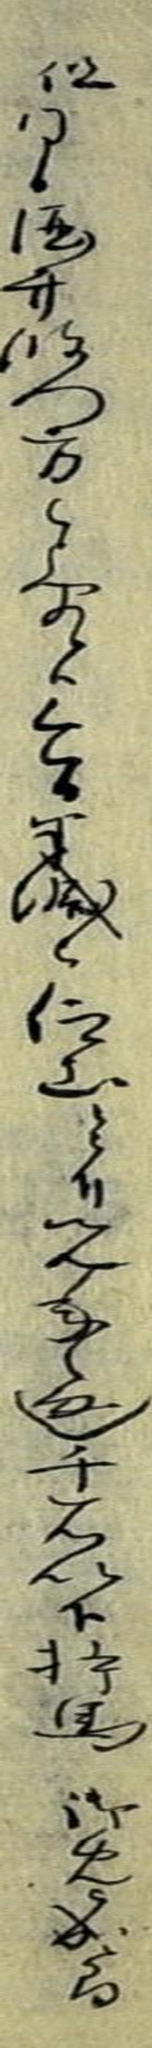但同日酒井波門方被申聞候ハ今日半減被仰出候ニ付先年之通千石以下持馬御免被成候間
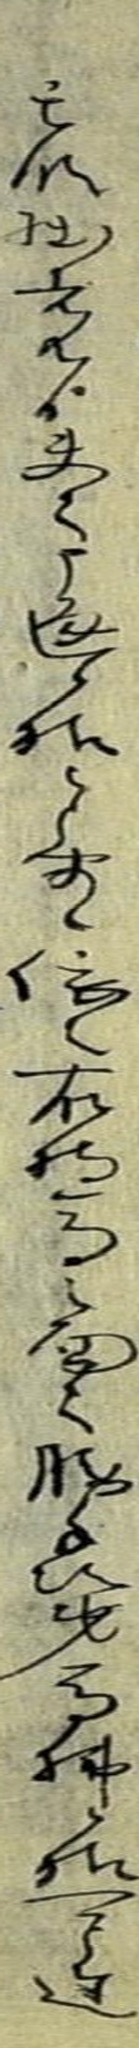其段拙者共ゟ夫々へ申通候様被申聞候依之右持馬之面々勝手次第馬払候様可申達
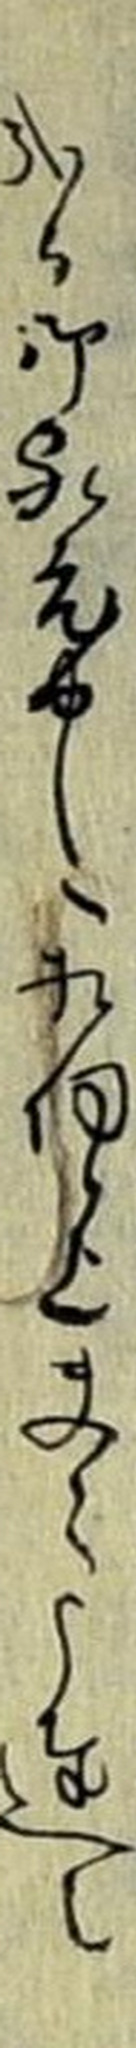哉与御家老中へ相伺候上夫々へ申達之
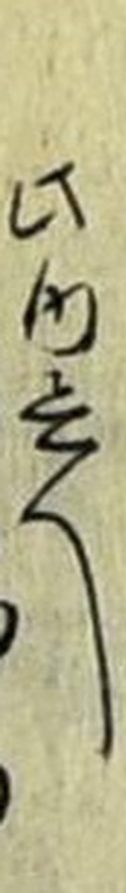此内壱人
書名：命令之部 三
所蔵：福井県文書館 Fukui Prefectural Archives
